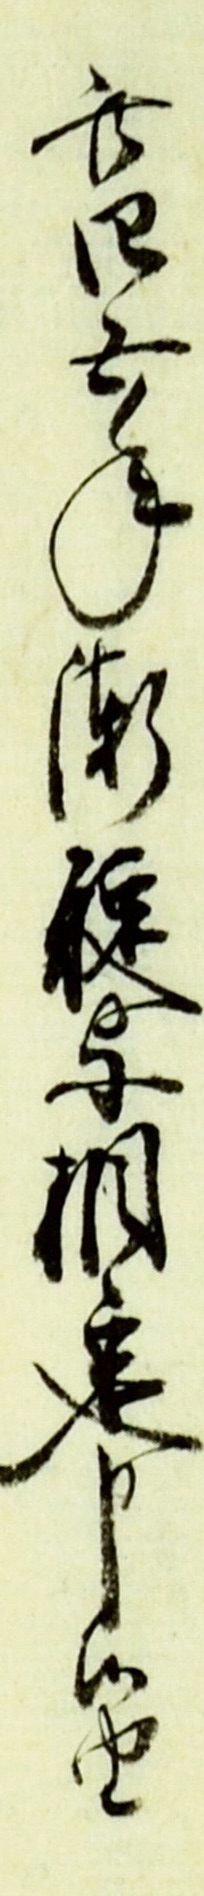此四五年漸聢与相定申候由
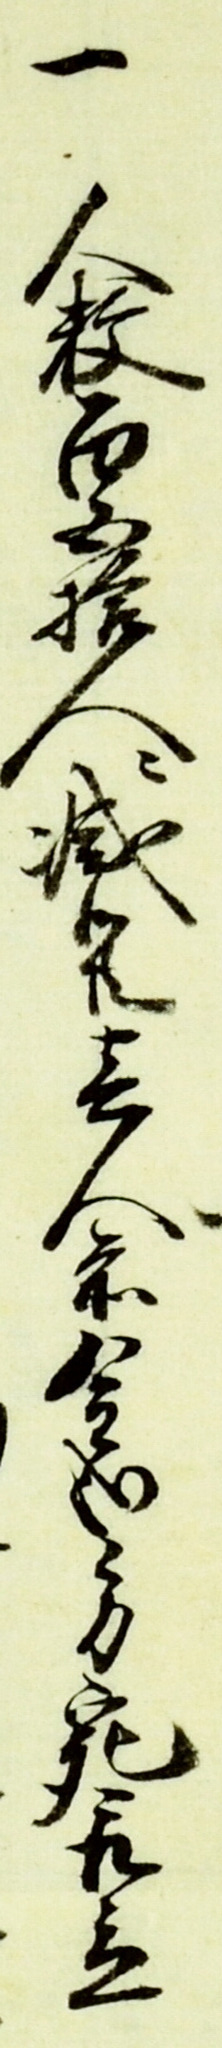一人数百五拾人ニ減候共壱人前金弐方宛取立
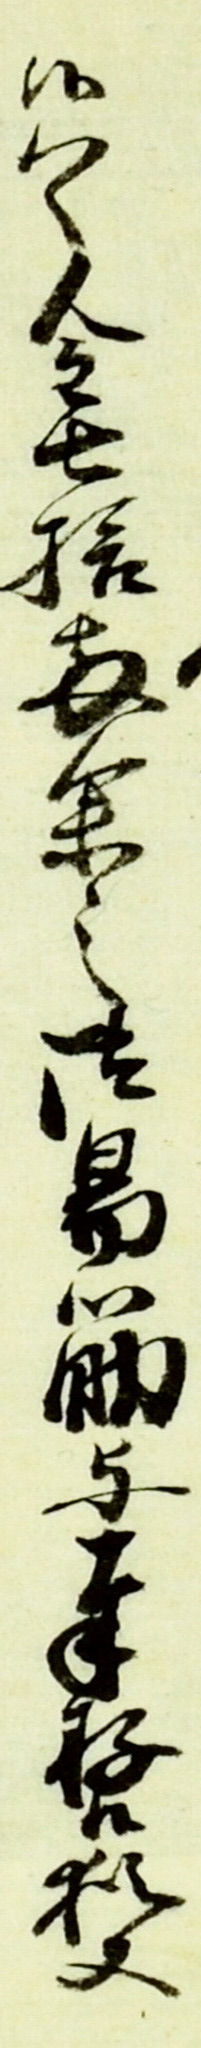候ハヽ金七拾両余之御易筋与奉存候猶又
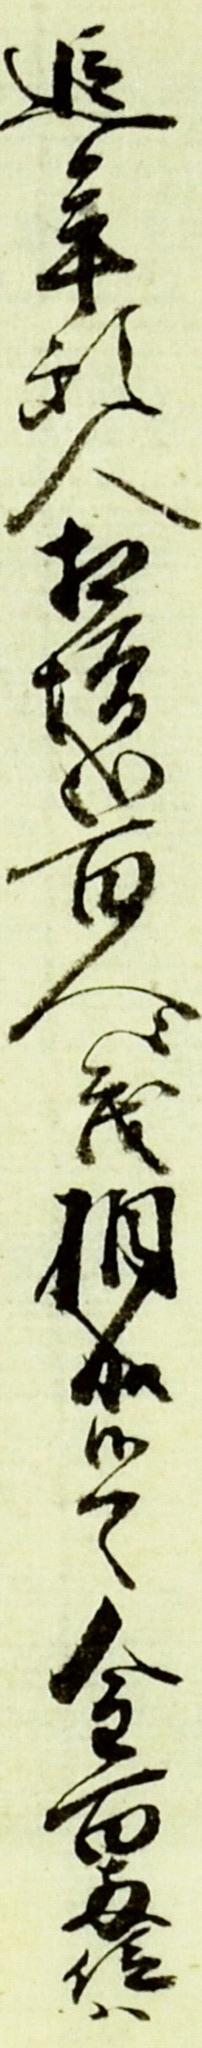追年願人相増弐百人ニ茂相成候ハヽ金百両位ハ
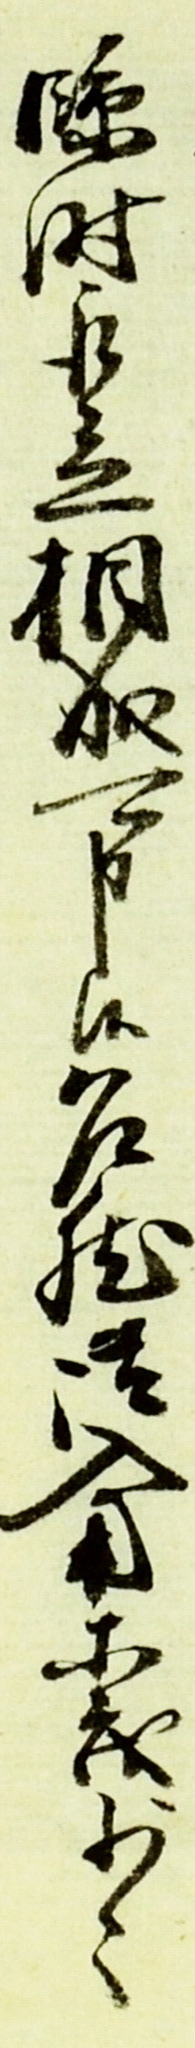臨時取立相成可申候乍然御入用等茂少々
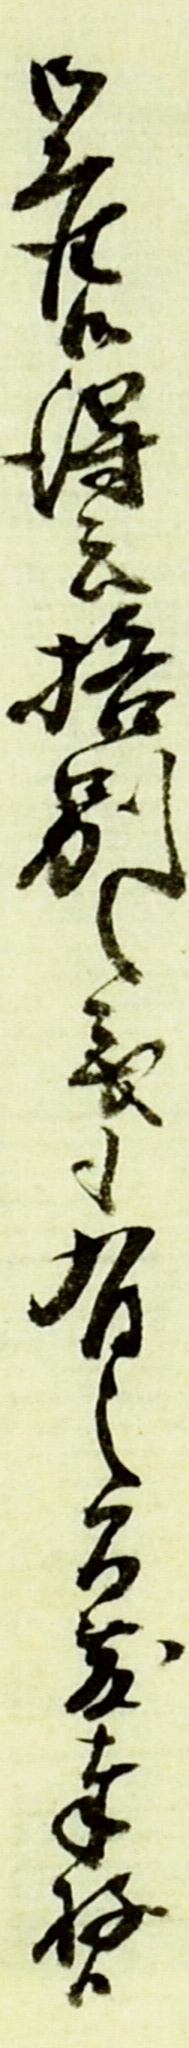御座候得者格別之義も有之間敷奉存候
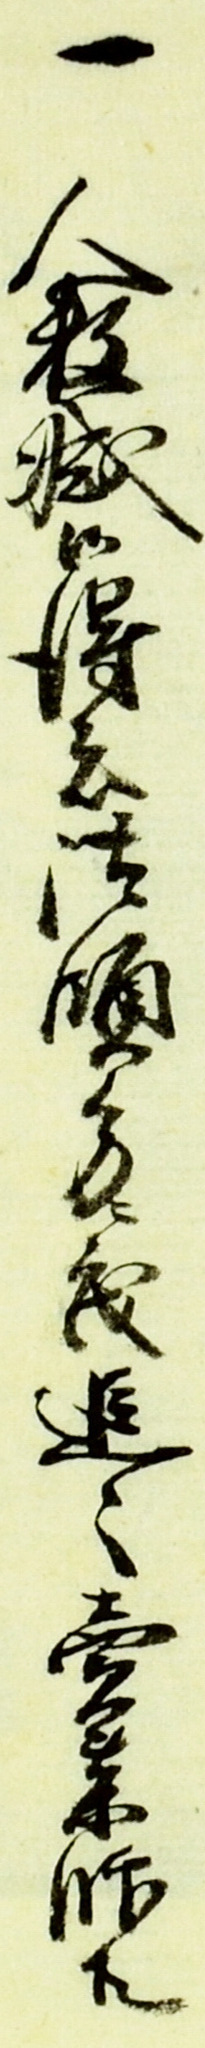一人数減候得者御領方ニ茂追々売薬師共
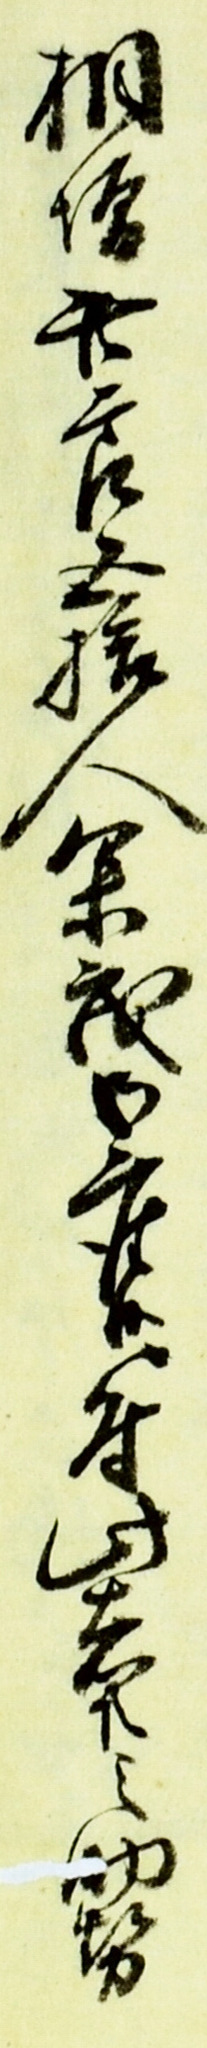相増此節五拾人余茂御座候ニ付此者共之助勢
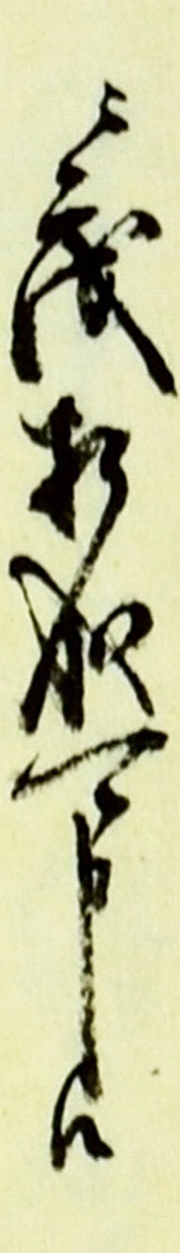ニ茂相成可申候
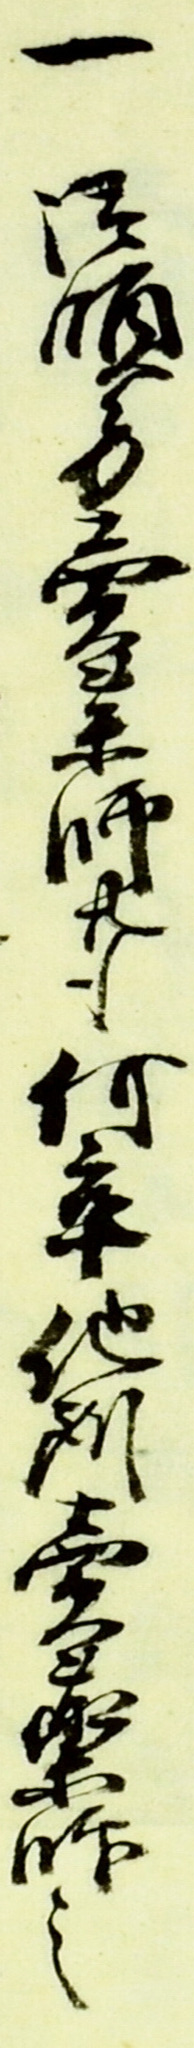一御領方売薬師共も何卒他所売薬師之
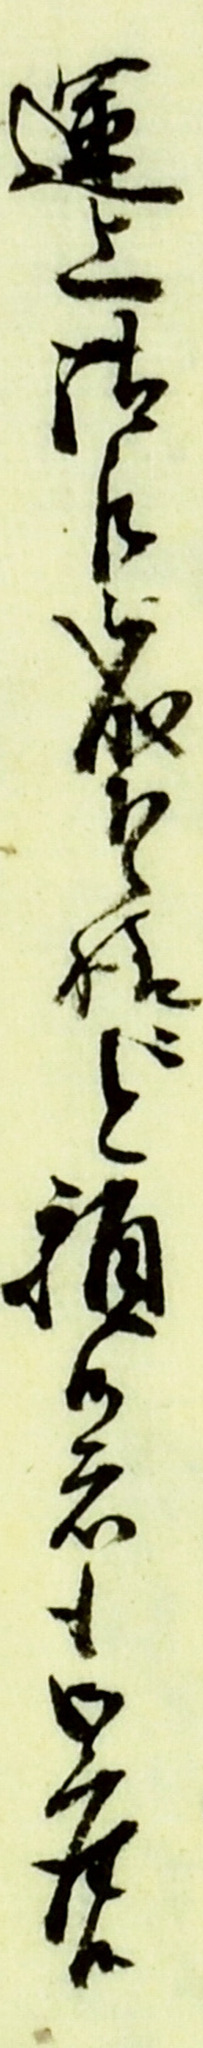運上御取被成下候様ニと願候者も御座候
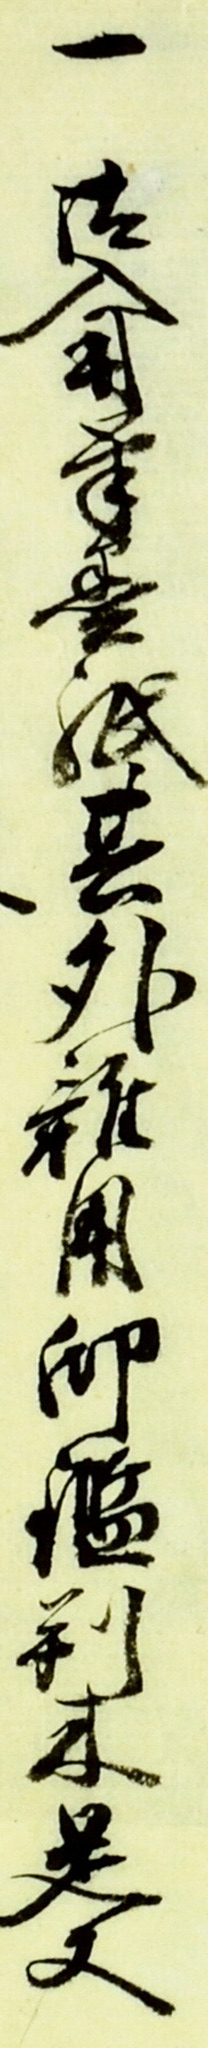一御入用筆墨紙其外雑用印鑑判木是又
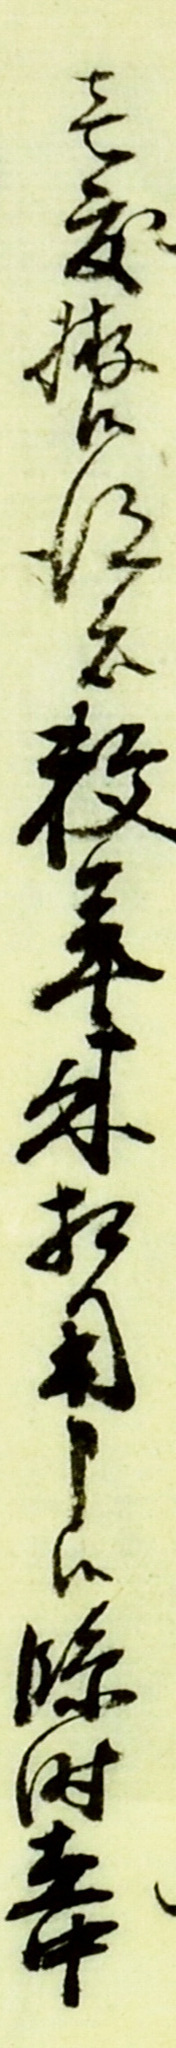壱度拵候得者数年来相用申候臨時在中
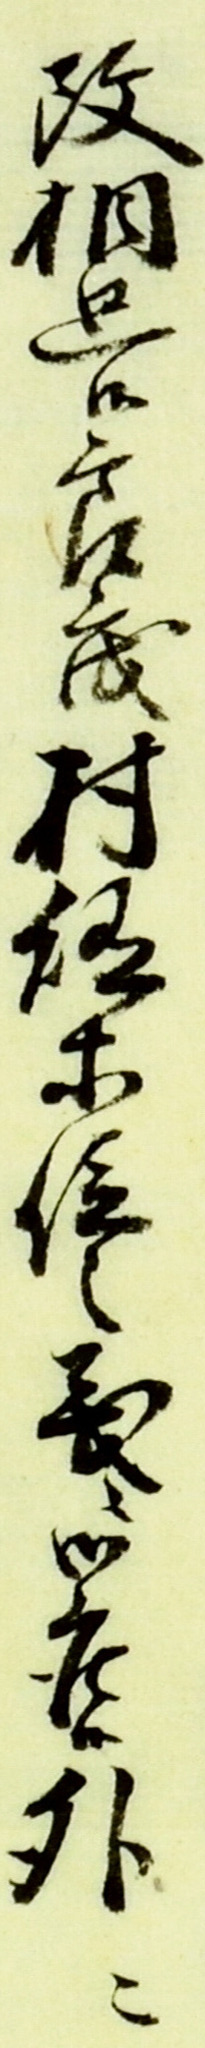改相廻候節茂村随等位之義ニ御座候外ニ
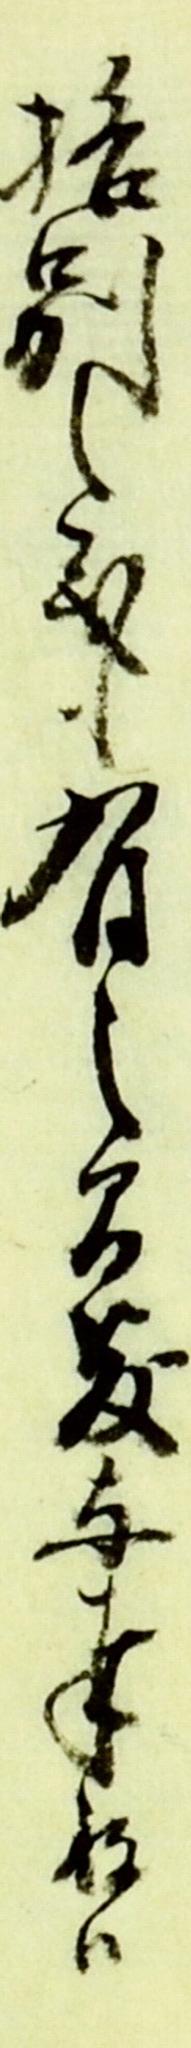格別之義も有之間敷与奉存候
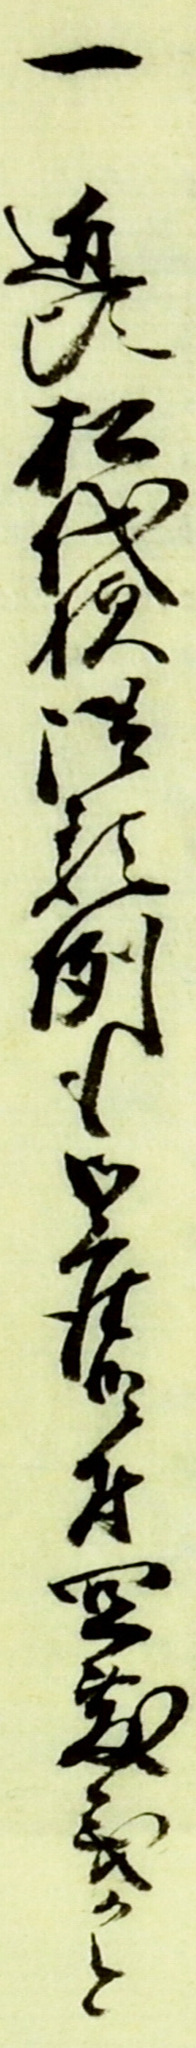一近頃松代様御類例も御座候ニ付宜敷義かと
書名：他国賣薬師運上之事
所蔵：伊那市立高遠町図書館・合同会社AMANE
